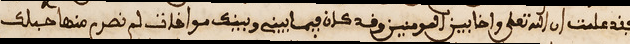فقد علمت ان الله تعلى واخا بين المومنين وقد كان فيما بينى وبينك مواخات لم نصرم منها حبلك
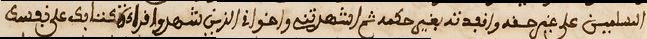المسلمين على غير حقه وانفدته بغير حكمه ثم اشهدتنى واخوانى الذين شهدوا قراءة كتابك على نفسك
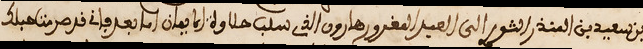بن سعيد بن المنذر الثورى الى العمد المغرور هارون الذي سلب حلاوة الايمان اما بعد فانى قد صرمت حبلك
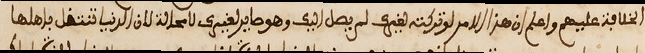الخلافة عليهم واعلم ان هذا الامر لو تركته لغيرك لم يصل اليك وهو صاير لغيرك لا محالة لان الدنيا تنتقل باهلها
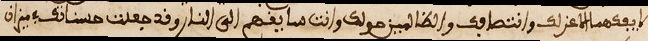لا يفكهما الا عزلك وانتصافك والظالمين صولك وانت سابقهم الى النار وقد جعلت حسناتك في ميزان
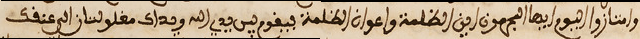وامتازوا اليوم ايها المجرمون ابن الظلمة واعوان الظلمة فيقوم بين يدى الله ويداك مغلولتان الى عنقك
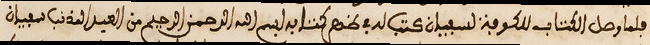فلما وصل الكتاب للكوفة لسفيان كتب له في ظهر كتابه بسم الله الرحمن الرحيم من العبد المذنب سفيان
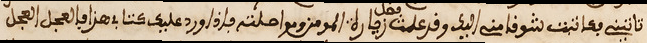تاتينى فكاتبت شوقا منى اليك وقد علمث زيارة المومن ومواصلته فاذا ورد عليك كتابي هذا فالعجل العجل
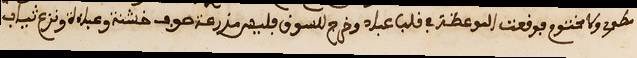مطوى ولا مختوم فوقعت الموعظة في قلب عباد وخرج للسوق فليس مذرعة صوف خشنة وعباءة وتزع ثياب
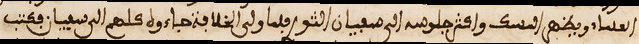العلماء ويظهر المسك واكثر جلوسه الى سفيان الثورى فلما ولى الخلافة جاءوه كلهم الى سفيان فكتب
